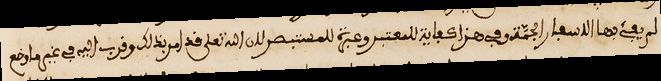لم يفى بها الاسفار الجمّة و في هذا كفاية للمعتبر و عبرة للمستبصر لان الله تعلى قد امر بذلك و قرب اليه في غير ما وضع
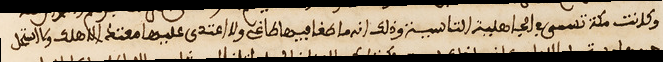و كانت مكة تسمى في الجاهلية التاسية و ذلك انه ما طغا فيها طاغى و لا اعتدى عليها معتد الا هلك و لا استحل
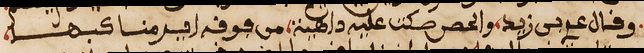و قال عدي بن زيد و الحصن صكت عليه داهية من فوقه ايد مناكبها
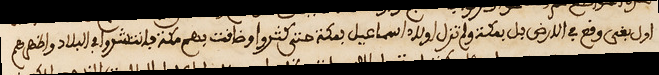اول بغى وقع في الارض بل بمكة و لم تزل اولاد اسماعيل بمكة حتى كثروا و ضاقت بهم مكة فانتشروا في البلاد و اظهرهم
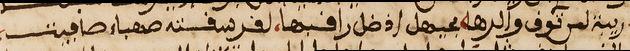ريبة لمن توق والدها مجيهل افضل راقبها لقد سقته صهباء صافيت
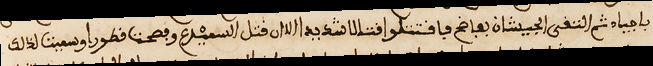باجياد ثم التقى الجيشان بفاضح فاقتتلوا اقتالا شديدا الا ان قتل السميدع و فصحت قطورا و سميت لذلك
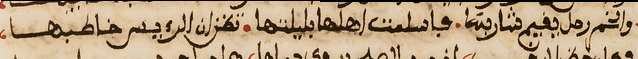و الخمر رمل يقيم شاربها فاسلمت اهلها بليلتها تظن ان الرءيس خاطبها
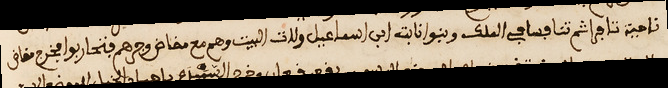ناحية تاجرا ثم تنافسا في الملك و بنوا نابت ابن اسماعيل ولات البيت و هم مع مضاض و جرهم فتحاربوا فخرج مضاض
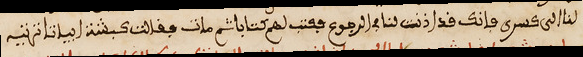لنا الى كسرى فانك قد اذنت لنا في الرجوع فكتب لهم كتابا ثم مات فقالت كبشة ابياتا ترتيه
